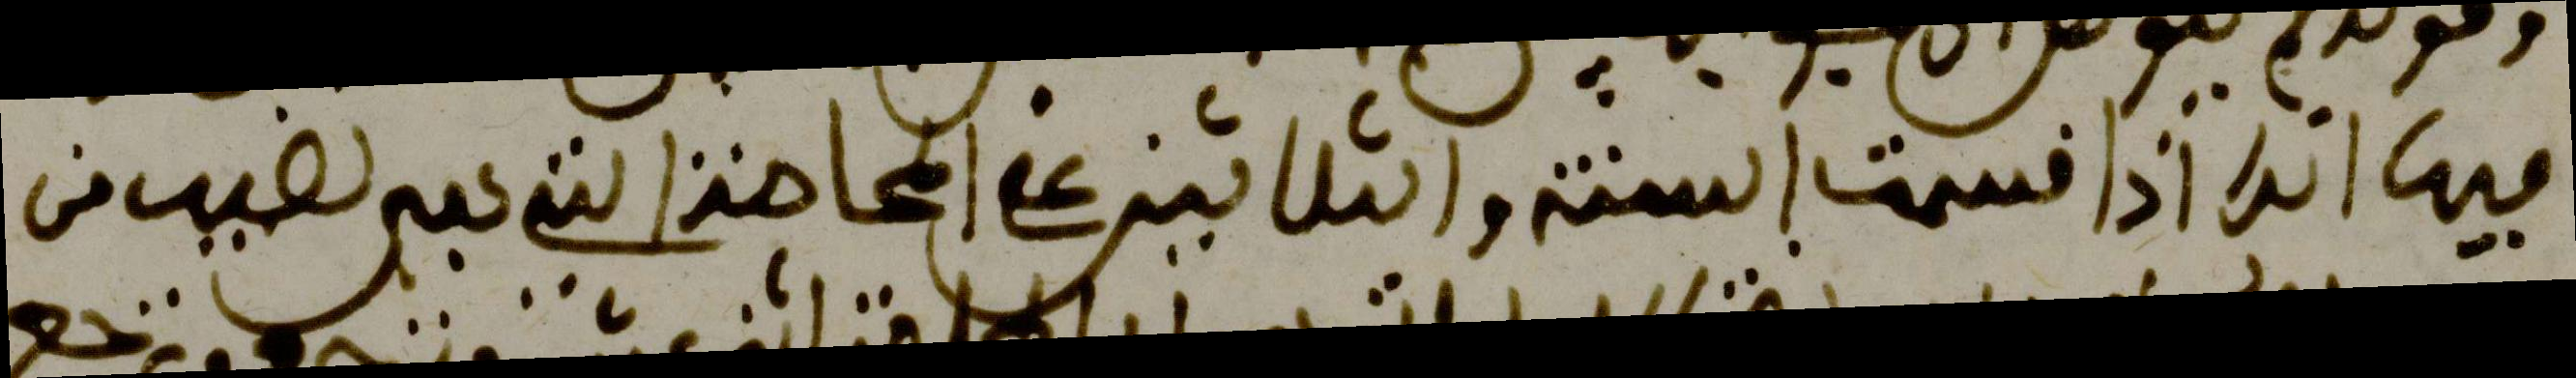فيها انك اذا اقسمت الستة والثلاثين على المحاصة التي هي نصيب من
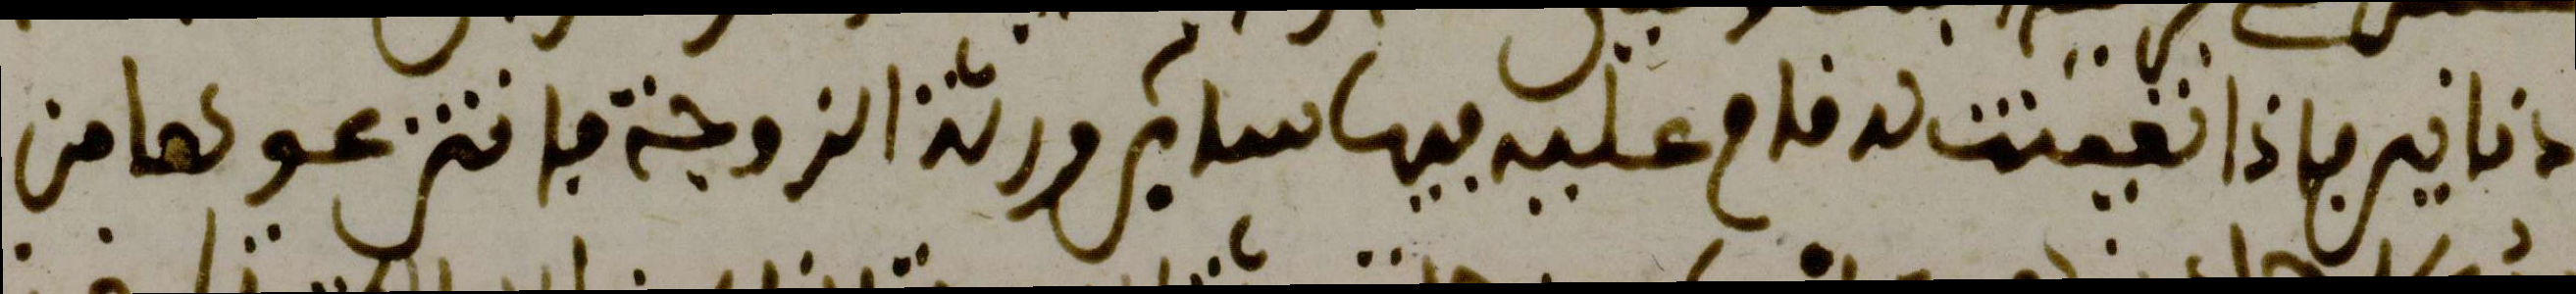دنانير فاذا تعينت له قام عليه فيها سائر ورثة الزوج فانتزعوها من
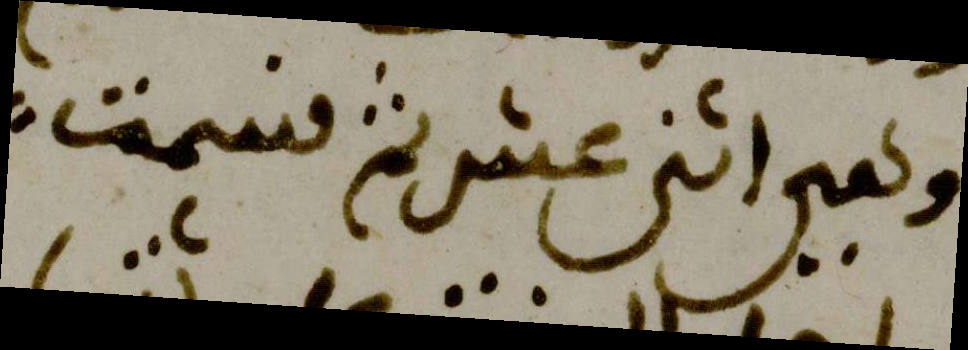وهي اثنى عشر ثم قسمت
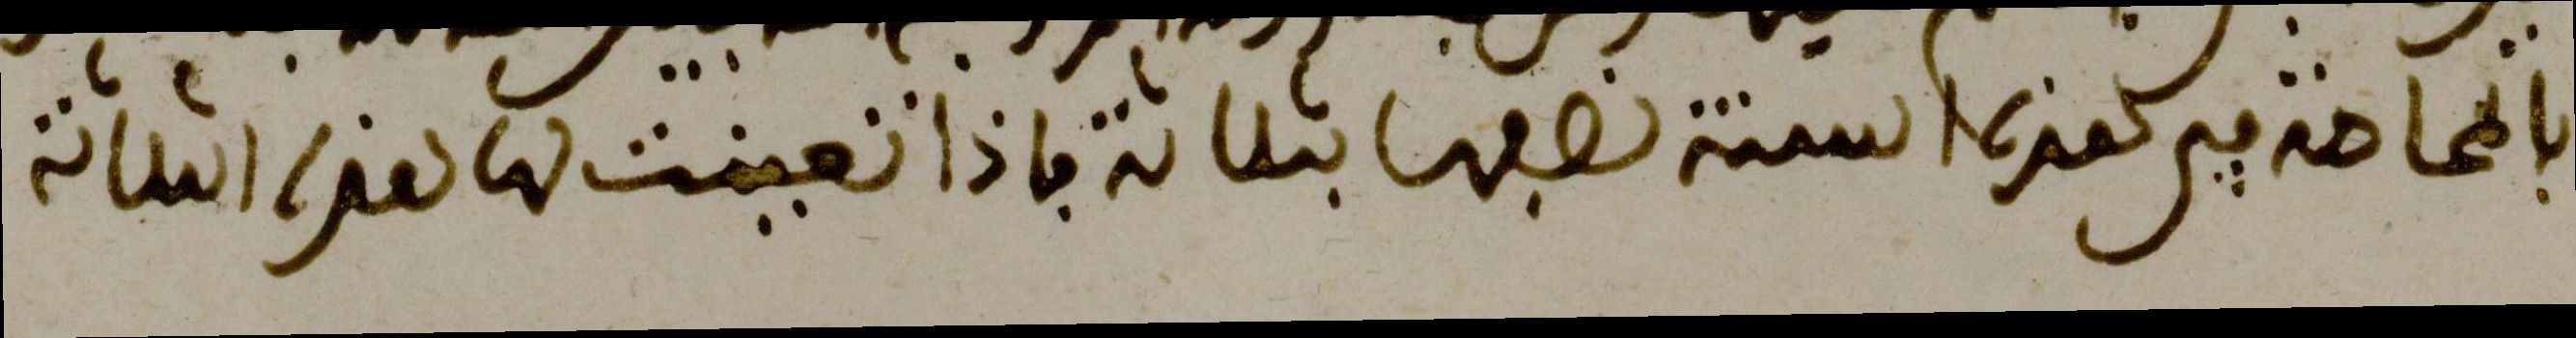بالمحاصة في هذه الستة نصفها بثلاثة فاذا تعينت لها هذه الثلاثة
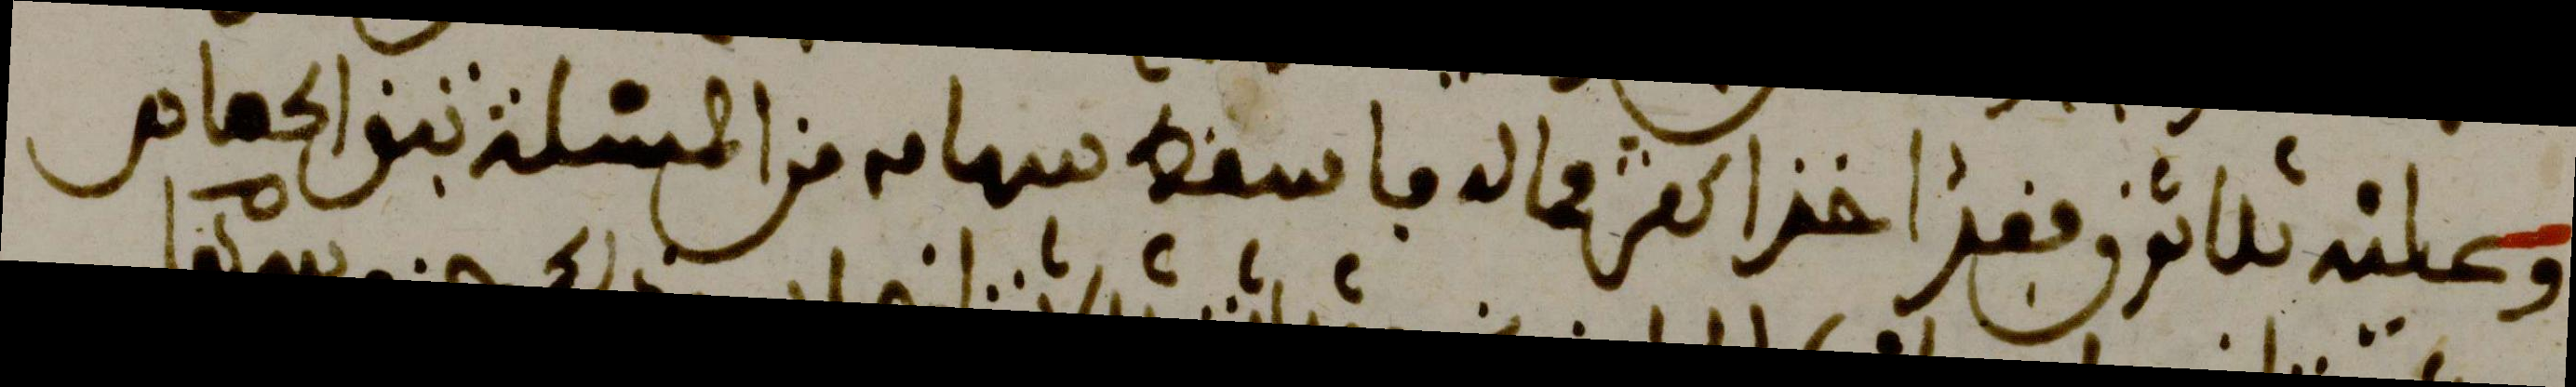وَعليْه ثلاثون فقد اخذ اكثر مما له فاسقط سهامه من المسْلة تبق الحصاص
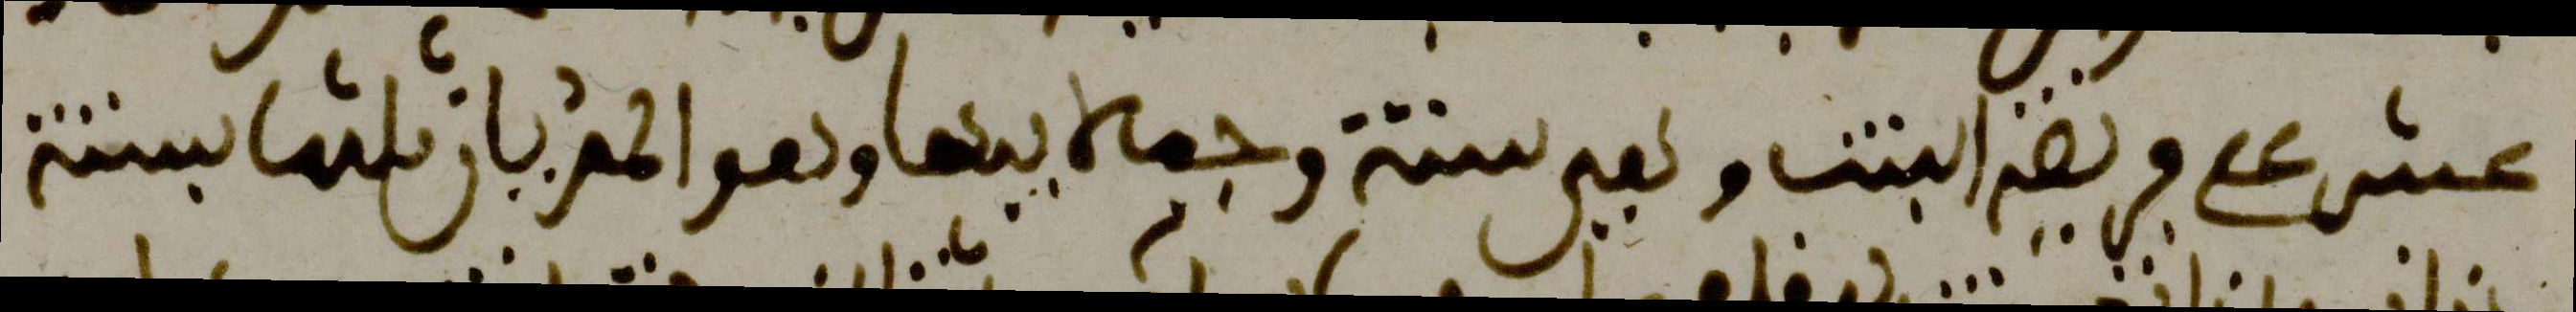عشر على فريضة البنت وهي ستة وجب لابيها وهو المديان ثلثها بستة
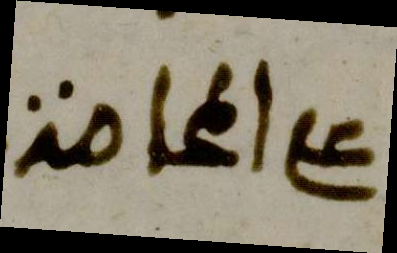على المحاصة
